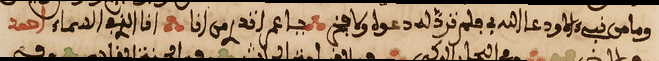وما من نبى ءالا ودعا الله بي فلم ترد له دعوه ولا فخر ياعمر اتدرى من انا انا الذي في السماء احمد
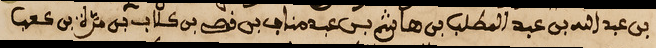بن عبد الله بن عبد المطلب بن هاشم بن عبد مناف بن قصى بن كلاب بن مرة بن كعب
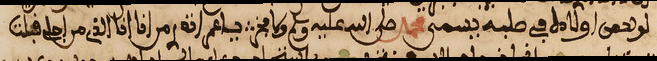لولد من اولاده في صلبه يسمى محمد صلى الله عليه وسلم ولا فخر ياعمر اتدرى من انا انا الذي من اجلى قبلت
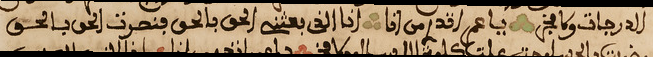الدرجات ولا فخر يا عمر اتدرى من انا انا الذي بعثنى الحق بالحق فنصرت الحق بالحق
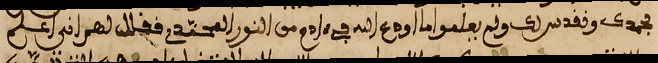بحمدك ونقدس لك ولم يعلموا ما اودع الله في ءادم من النور المحمدى فقال لهم انى اعلم
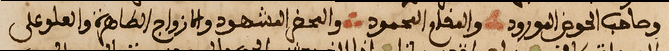وصاحب الحوض المورود والمقام المحمود والمحضر المشهود والازواج الطاهرة والعلو على
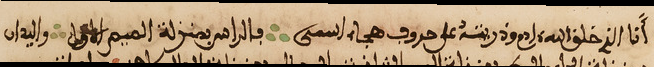وانا الذي خلة الله ءادم وذريته على حروف هجاء اسمى فالراس بمنزلة الميم الاو ل واليدان
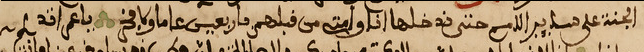الجنة على سائر الامم حتى ندخلها انا وامتى من قبلهم فاربعين عاما ولا فخر ويا عمر اتدرى
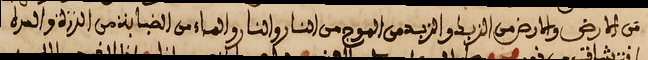من الارض والارض من الزبد والزبد من الموج من النار والنار والماء من الضبابة من الدرة والدره
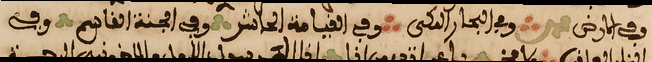وفي الارض محمد وفي البحار المكى وفي القيامة الحاشر وفي الجنة القاسم وفي
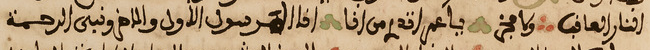النار العاقب ولا فخر ياعمر اتدرى من انا انا ال#رسول الاول والاخر ونبى الرحمة
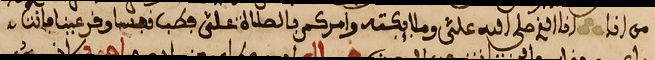من انا انا الذي صلى الله على وملائكته وامركم بالصلاة على فطب نفسا وقر عينا فانت
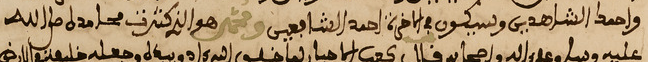واحمد الشاهدين وسيكون في الاخرة احمد الشافعين ومحمد هو الذي كثرت محامده صلى الله
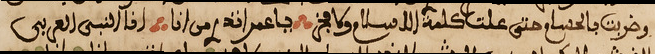وضربت فالحسام حتى علت كلمة الاسلام ولا فخر يا عمر اتدرى من انا انا النبى العربى
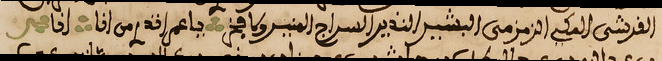القرشى المكي الزمزمى البشير النذير السراج المنير ولا فخر ياعمر اتدرى من انا انا محمد
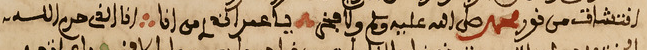انتشات من نور محمد صلى الله عليه وسلم ولا فخر يا عمر اتدرى من انا انا الذي حرم الله
